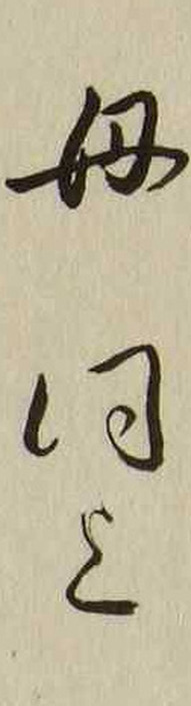母同上
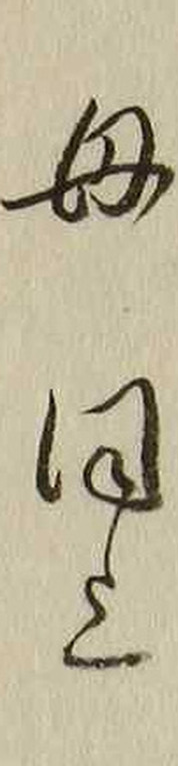母同上
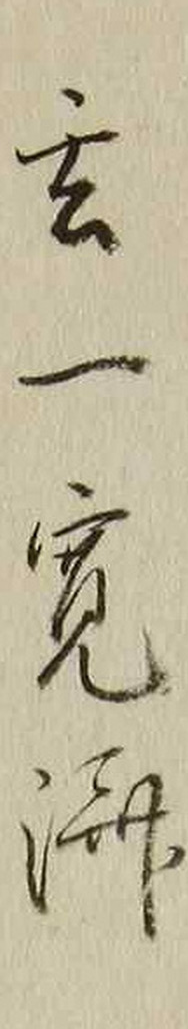玄一寛済
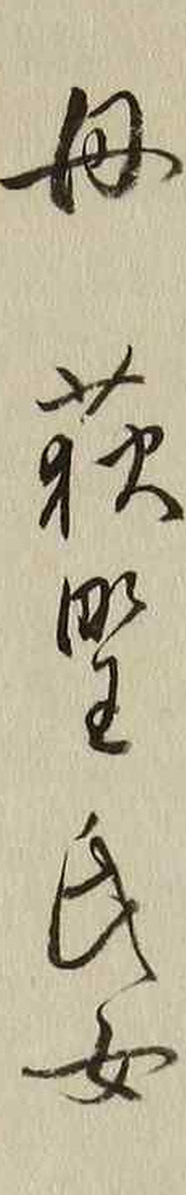母萩野氏女
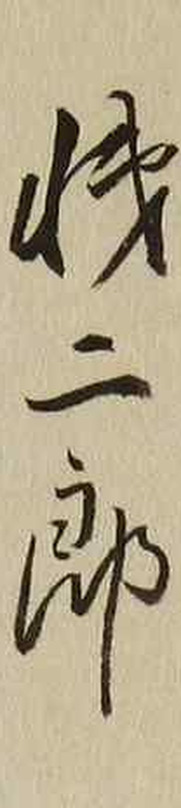悌次郎
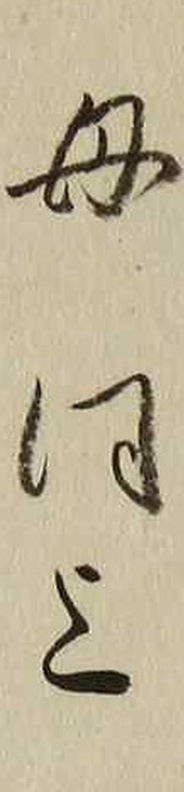母同上
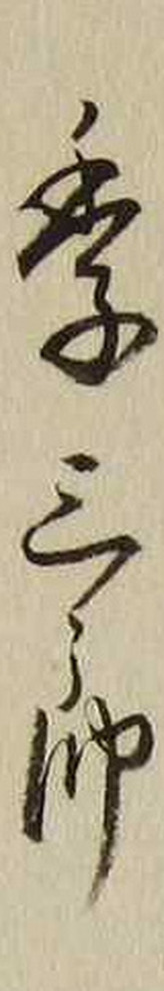季三郎
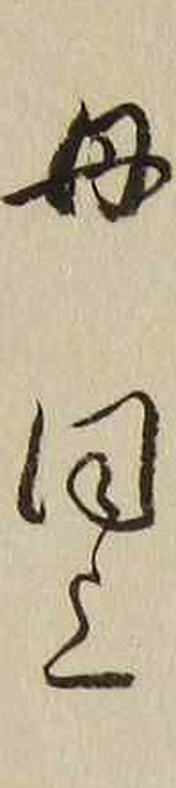母同上
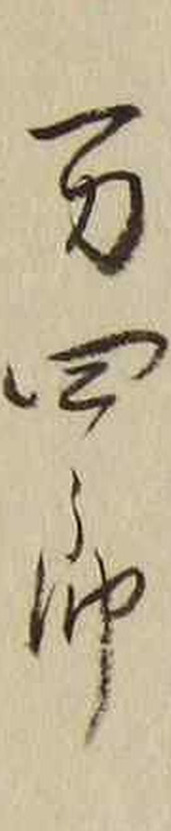万四郎

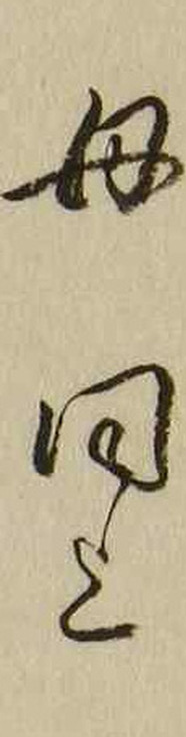母同上
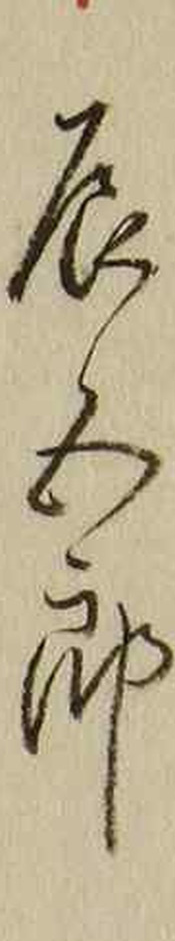辰五郎
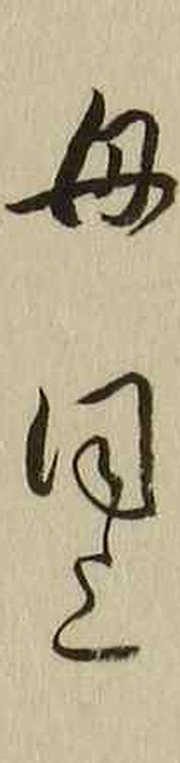母同上
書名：諸士系譜　巻之8　い之部8
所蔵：会津若松市立会津図書館
